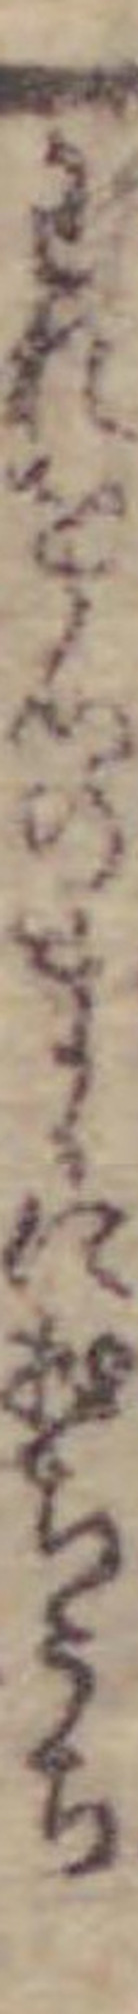われを心のまゝにむちうち
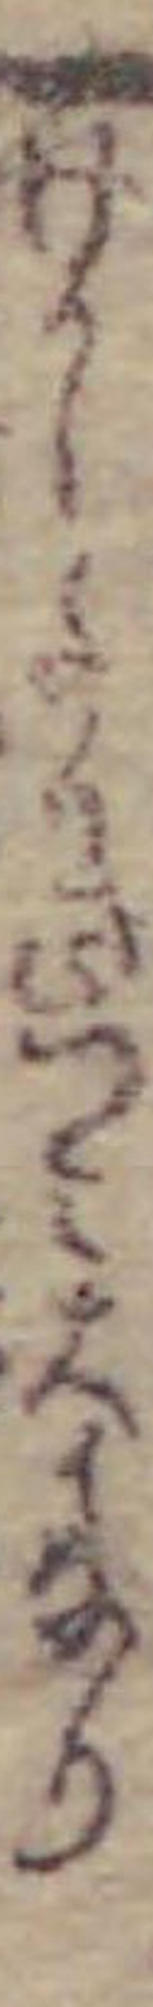けかしよも此つみ大
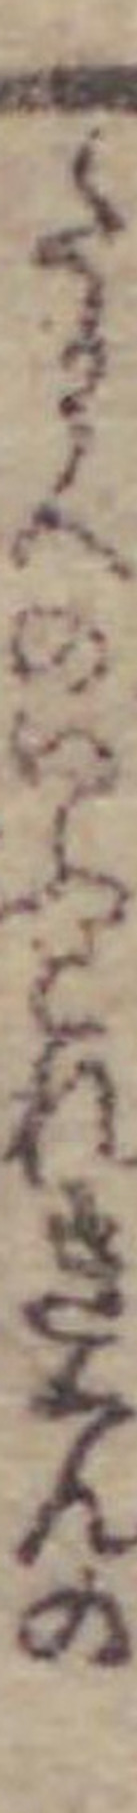たる人のいふこれきくんの
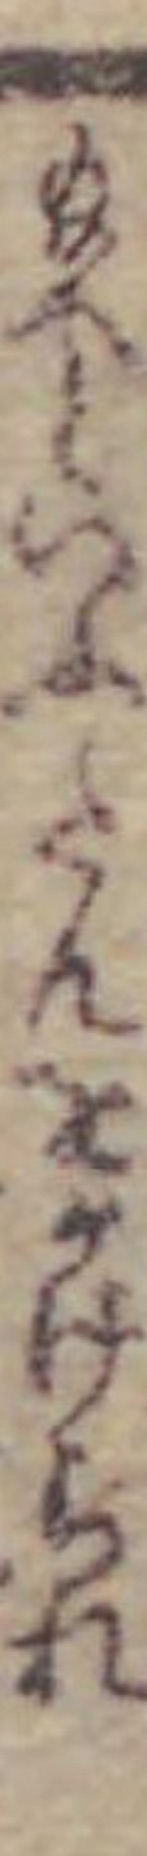給へといふたんをかけられ
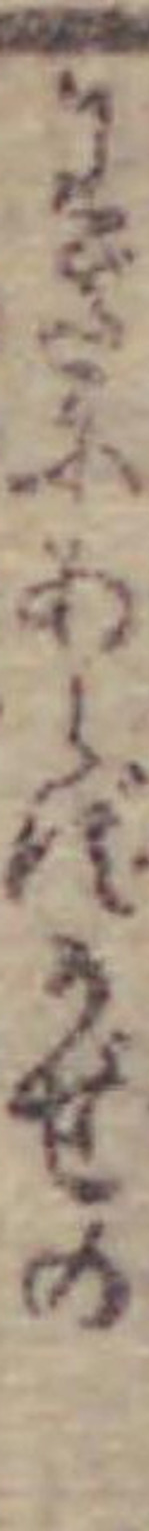わざにあらずかぜの
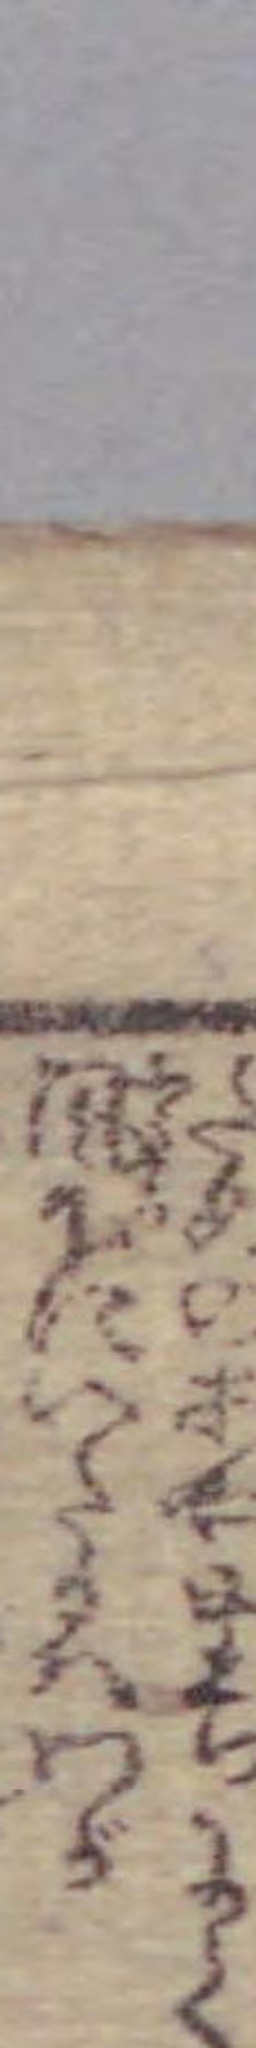風下にいたるはわが
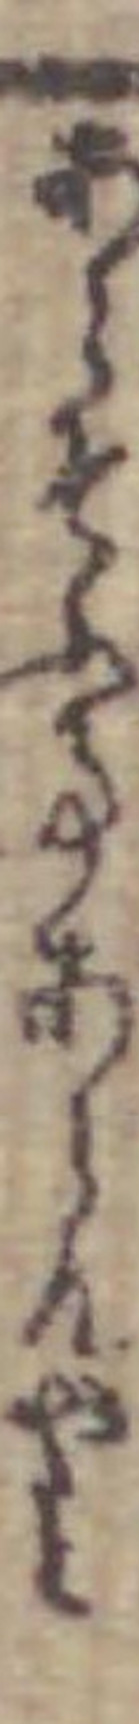あらそふ事あらんやと
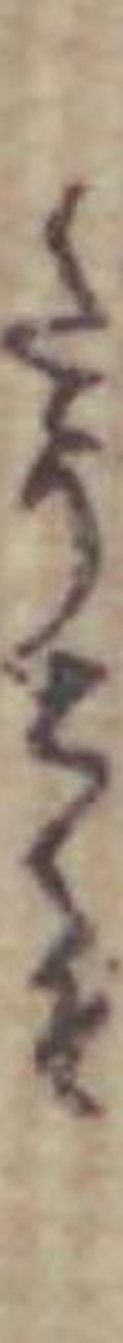だうとくぞ
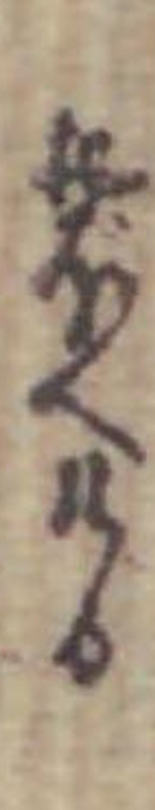おぼへける

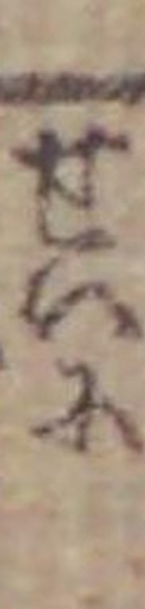せいに
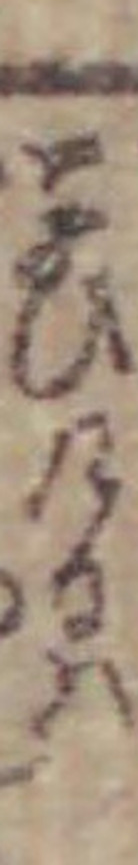とひけるは
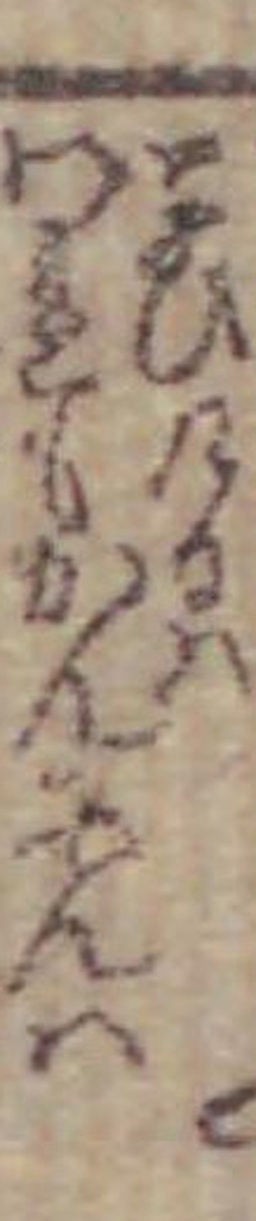われもかんにんは
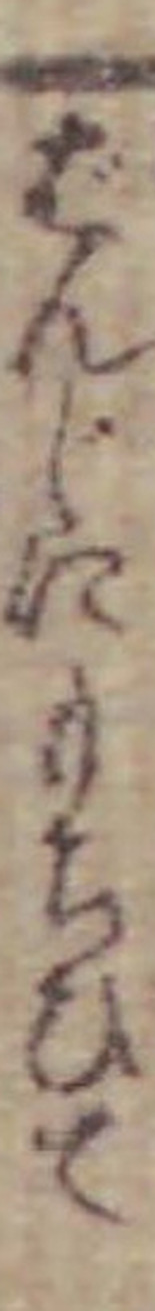ばんじにもちひて
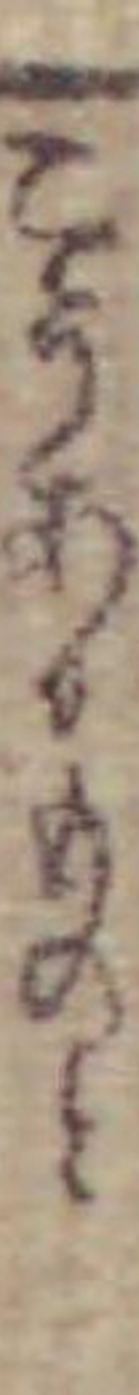こうあるものと
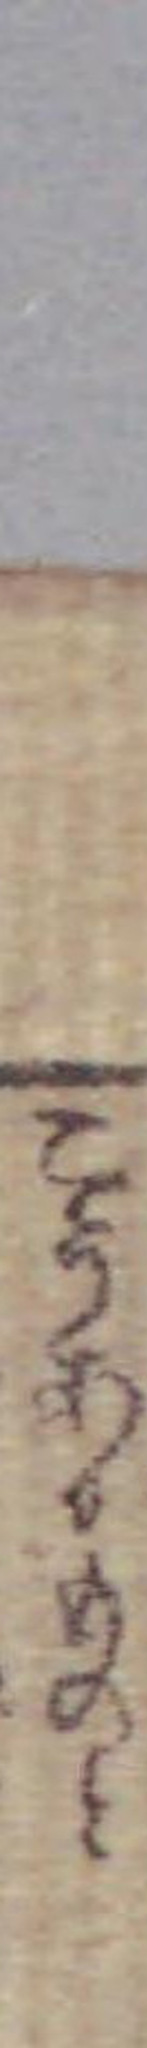こうあるものと
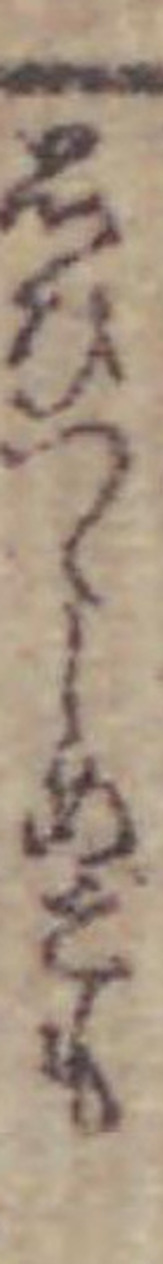思ひつゝしめども
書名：和荘兵衛後日話 : 3巻
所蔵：国立国会図書館 National Diet Library, JAPAN
